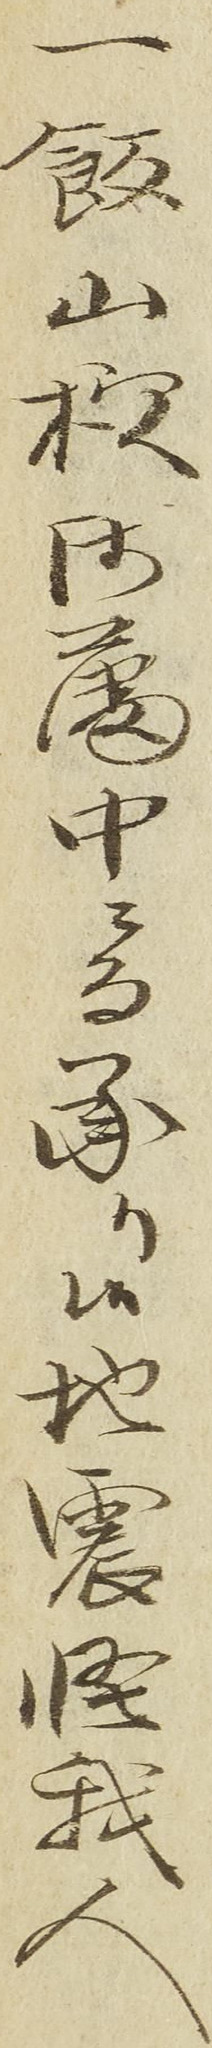一飯山様御藩中二而承り候地震怪我人

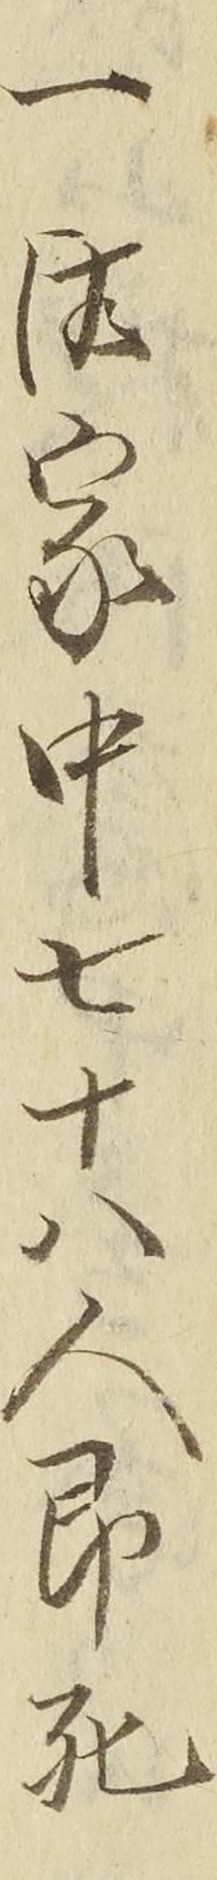一住家中七十八人即死
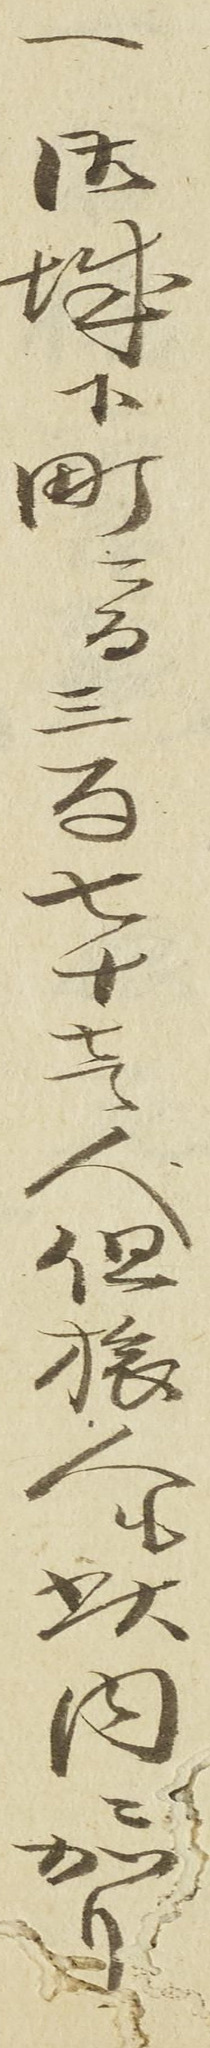一御城下町二而三百七十壱人但旅人も此内二加り
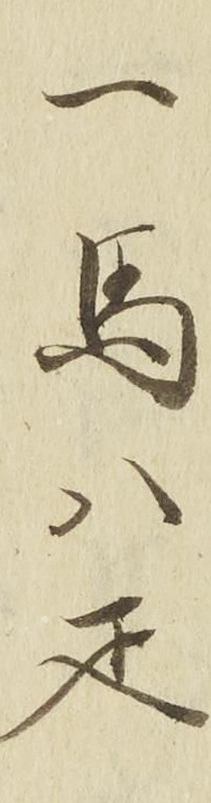一馬八疋
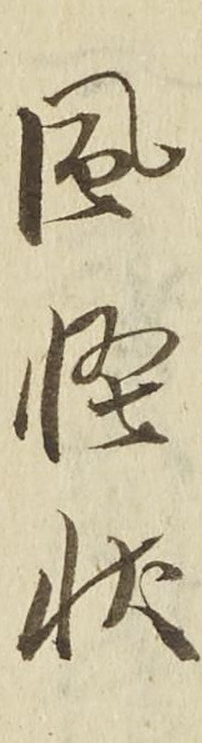風怪状
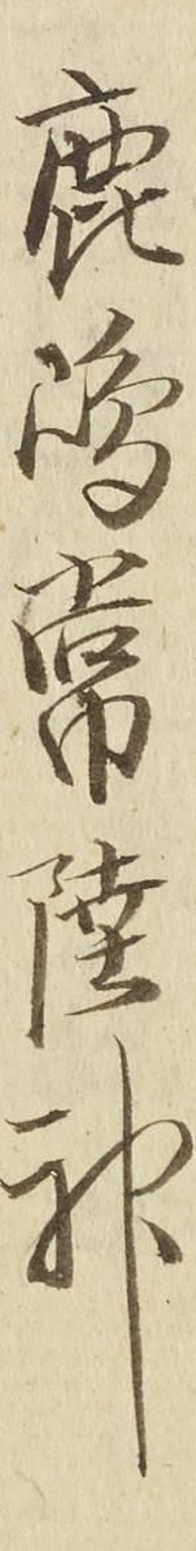廉嶋常陸神
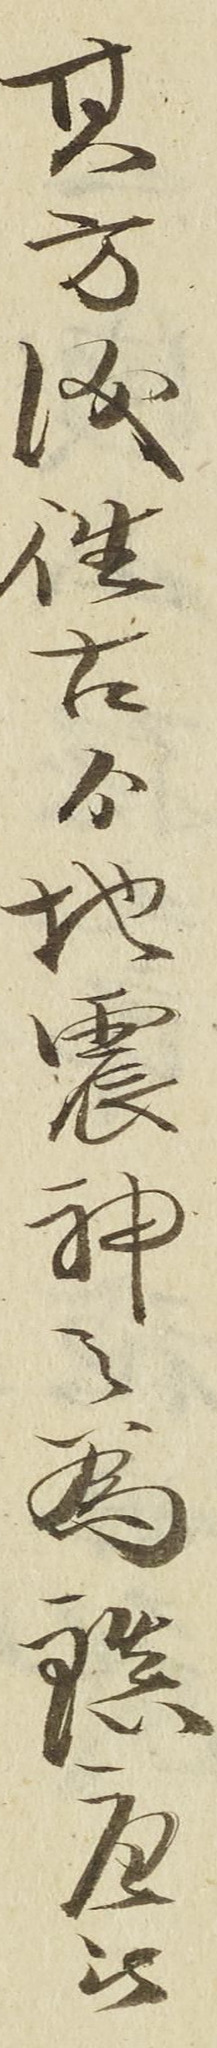其方儀往古ゟ地震神之為メ鎮座仰
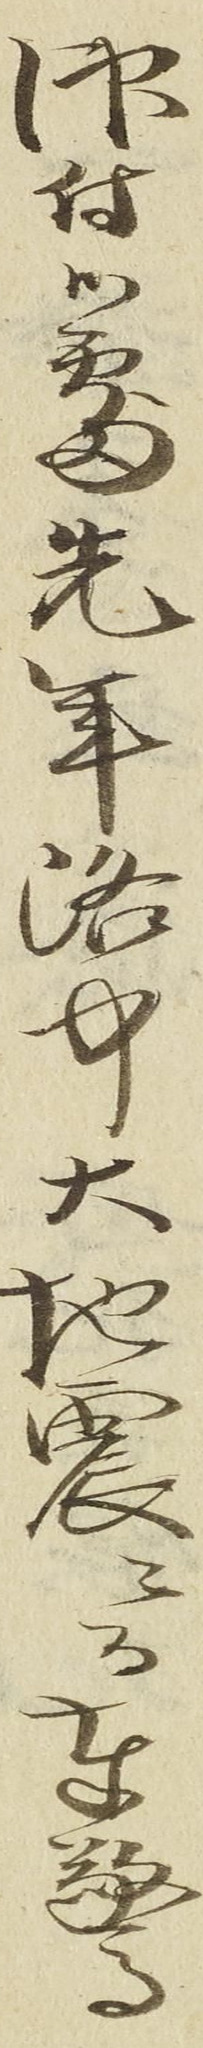付候処先年洛中大地震二而申驚
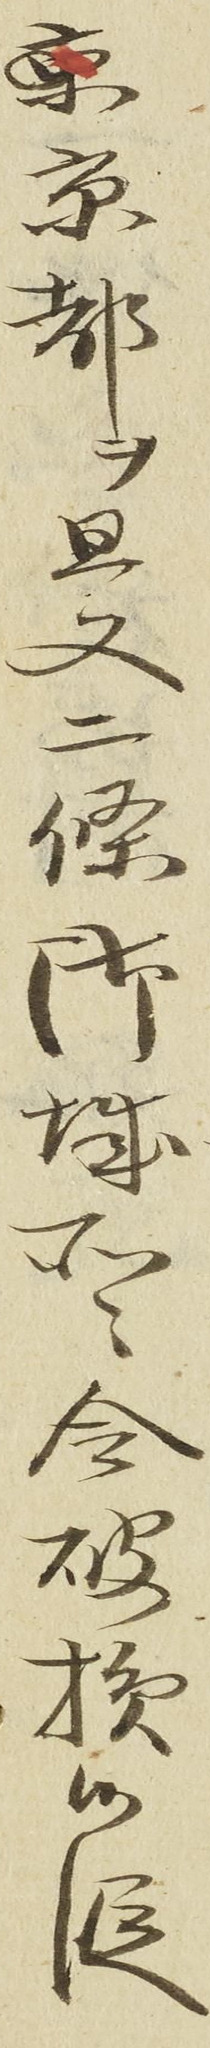京都ヲ且又二条御城所々今破損候段
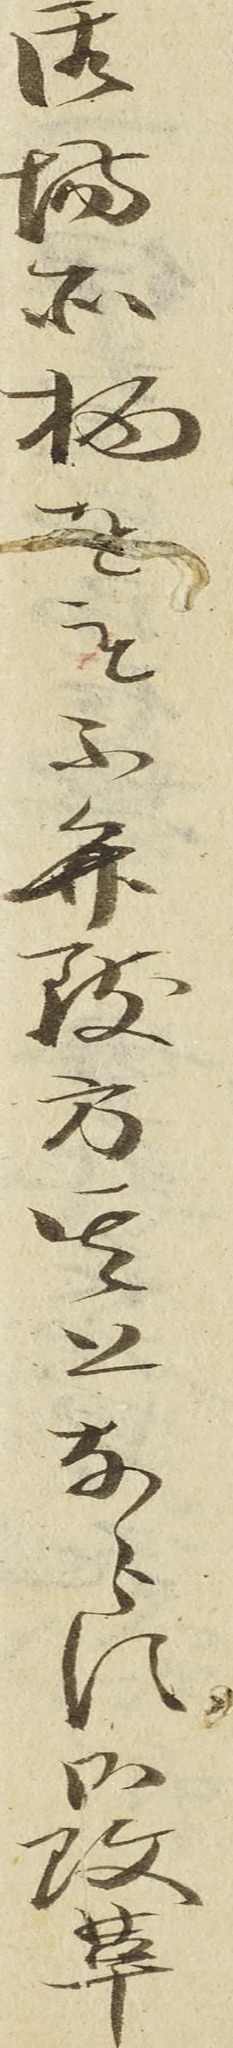御場所柄をも不弁致方其上不ならす御政革
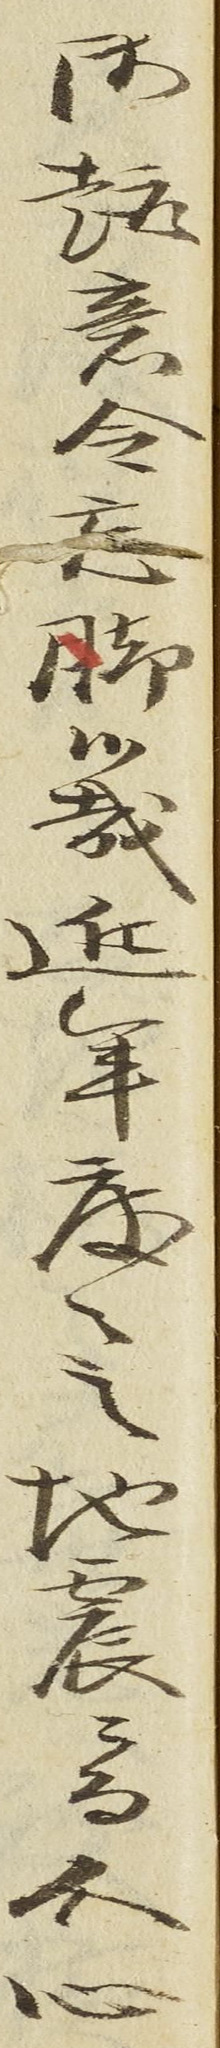御趣意令忘却候哉近年度々之地震二而不
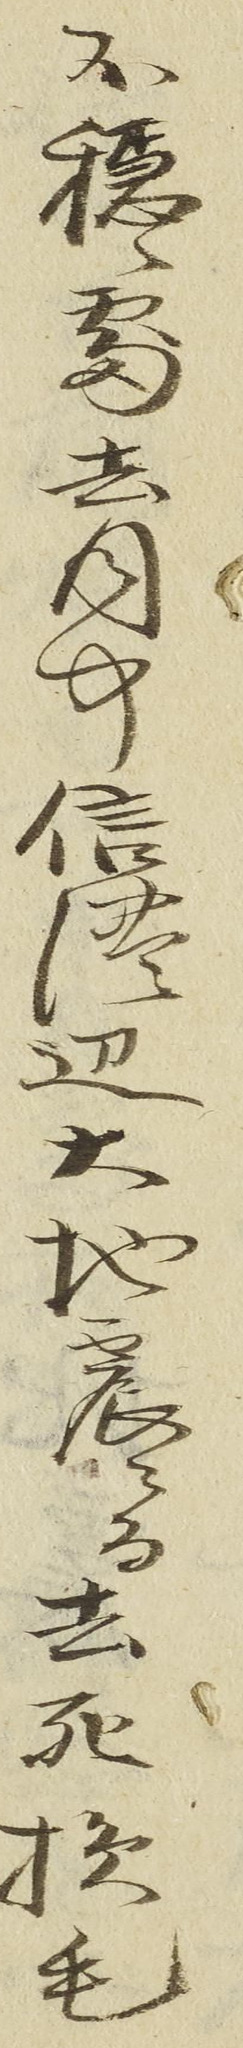不穏候処去月中信濃辺大地震二而去死損毛
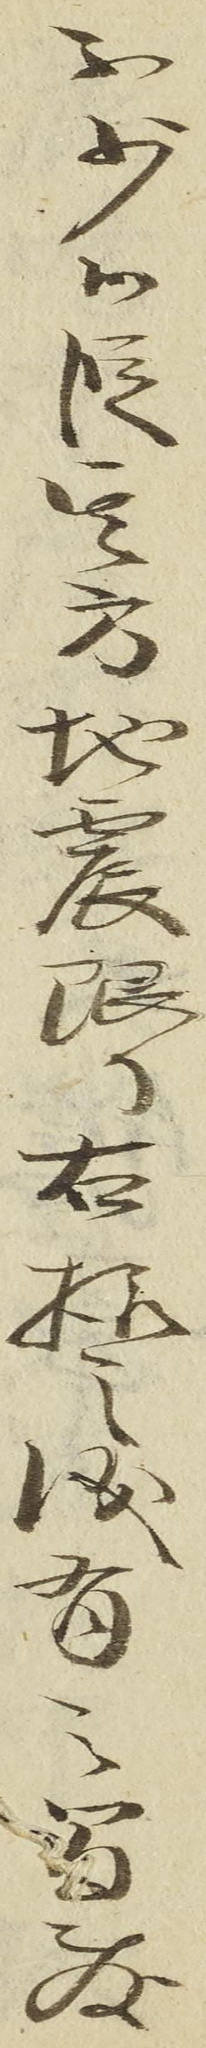不少候段其方地震限り右様之儀有之間敷
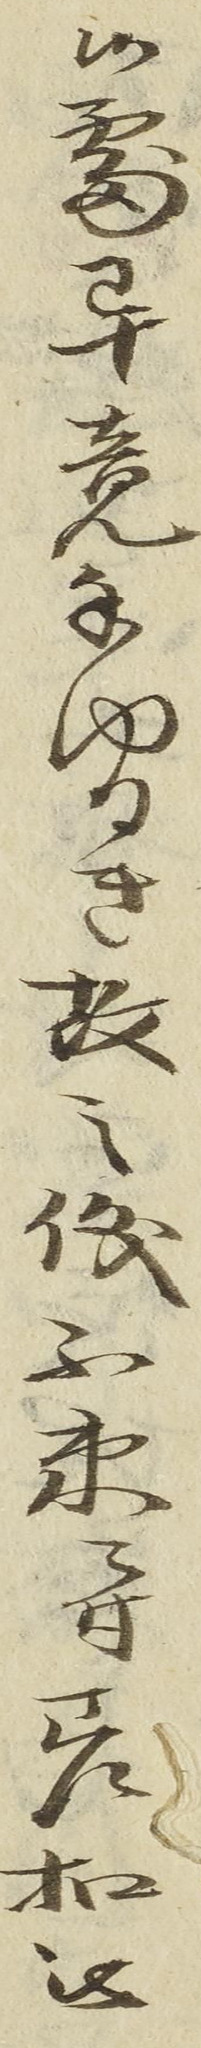候処畢竟手ゆるき故之儀不束二付差扣被
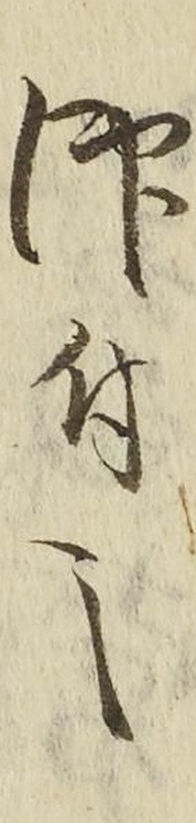仰付之
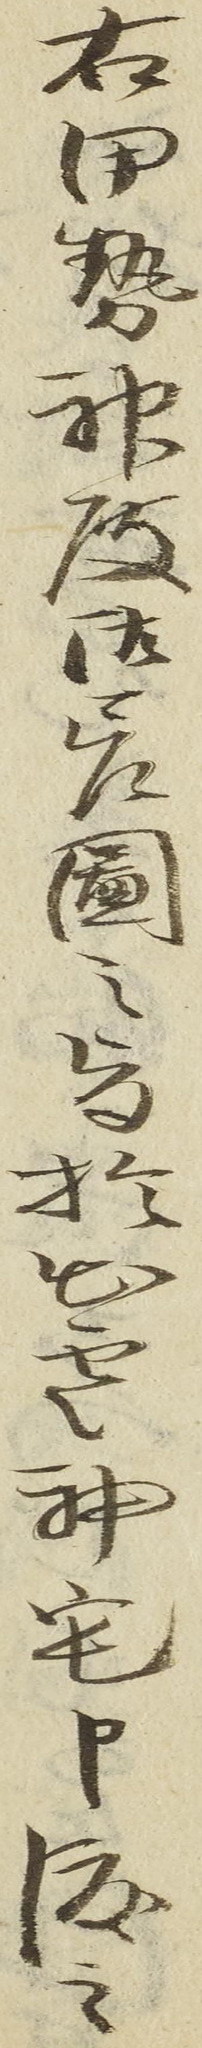右伊勢神殿御差図之旨於出雲神宅申渡之
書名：信濃國大地震記　乾
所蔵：東京大学地震研究所図書室 Earthquake Research Institute Library, The University of Tokyo, JAPAN
